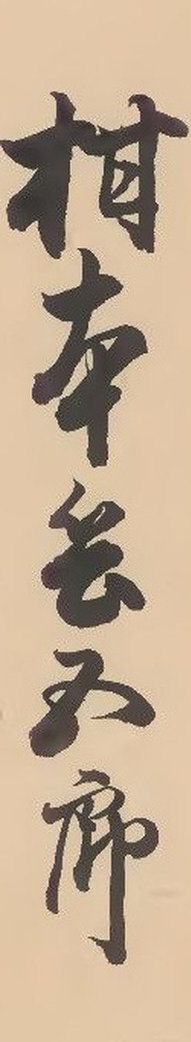柑本兵五郎
